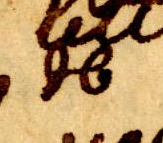H
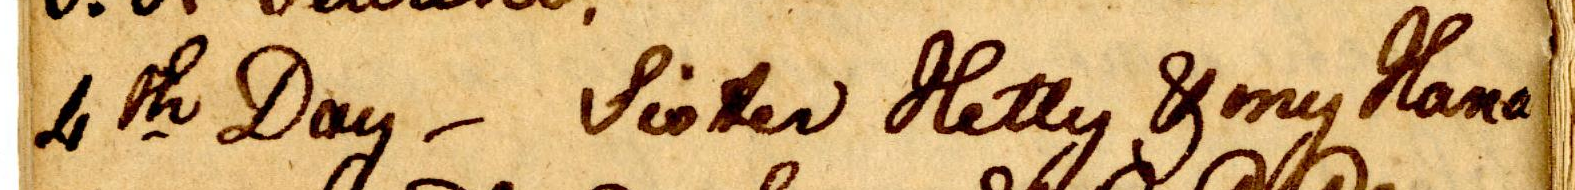4^th Day- Sister Hetty & my Hana
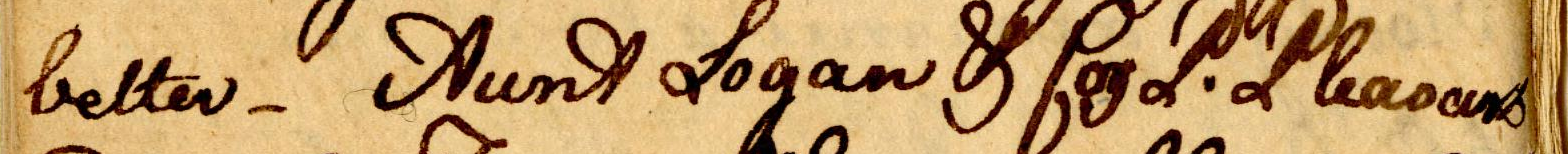better- Aunt Logan & Coz P. Pleasants
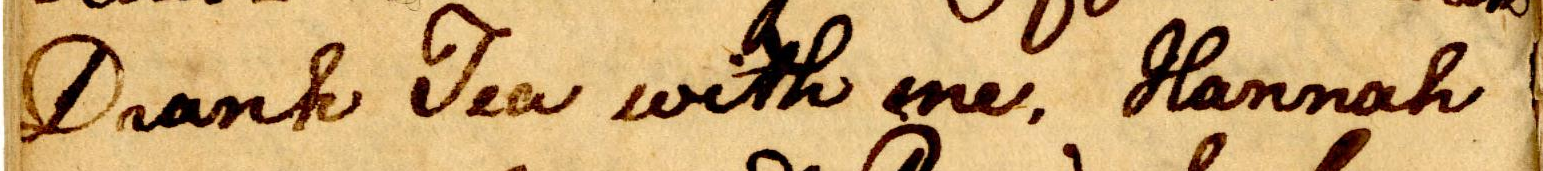Drank Tea with me, Hannah
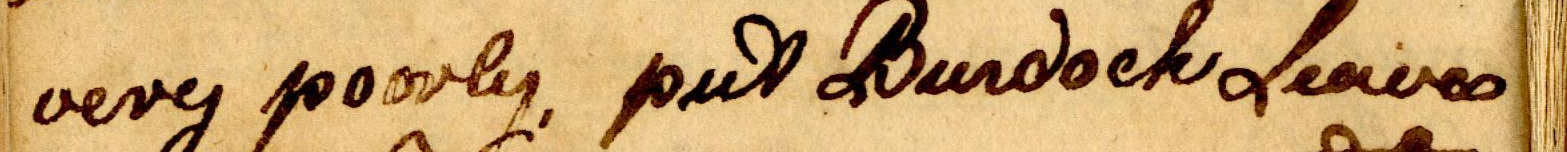very poorly, put Burdock Leaves
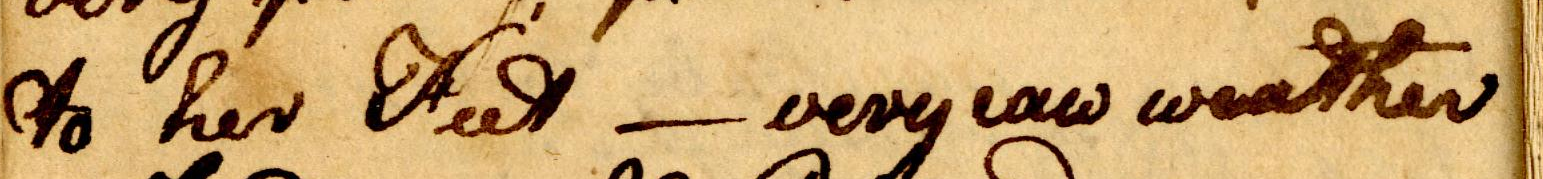to her Feet- very raw weather
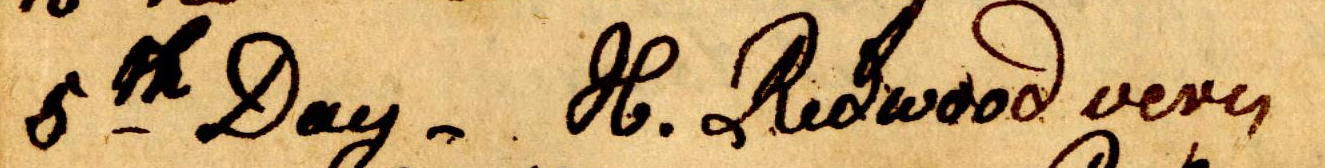5^th Day- H. Redwood very
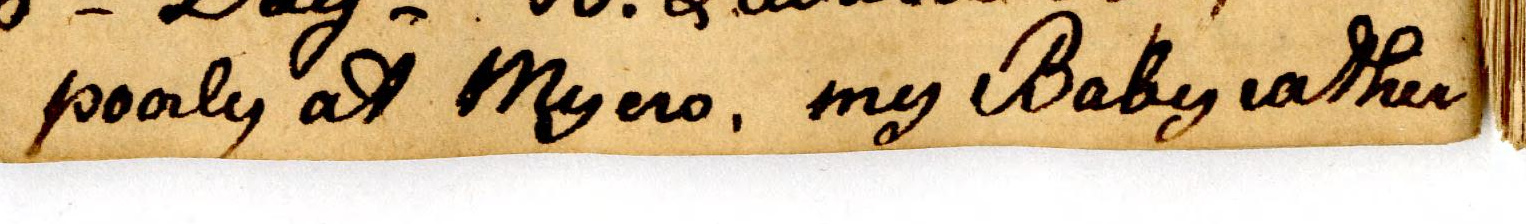poorly at Myers, my Baby rather,
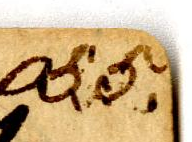55
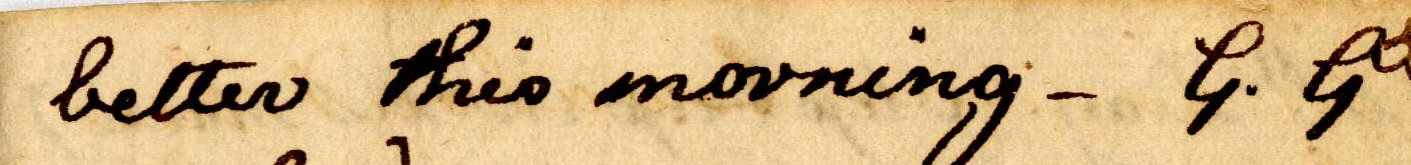better this morning- G. G
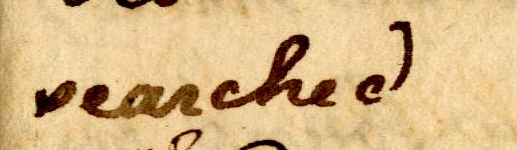searched
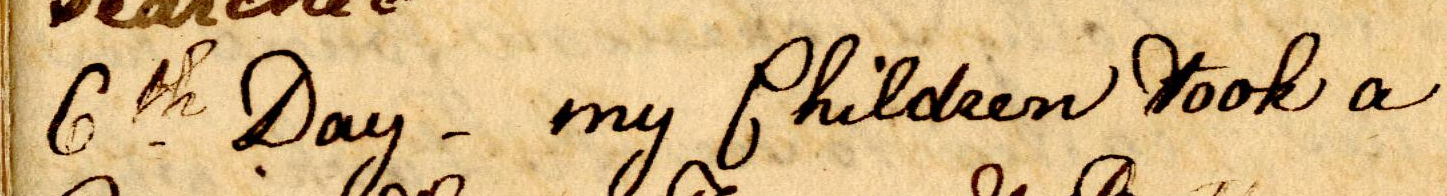6^th Day- my Children took a
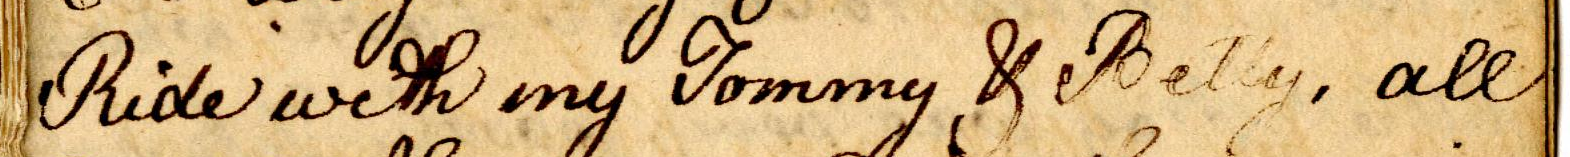Ride with my Tommy & Betty, all
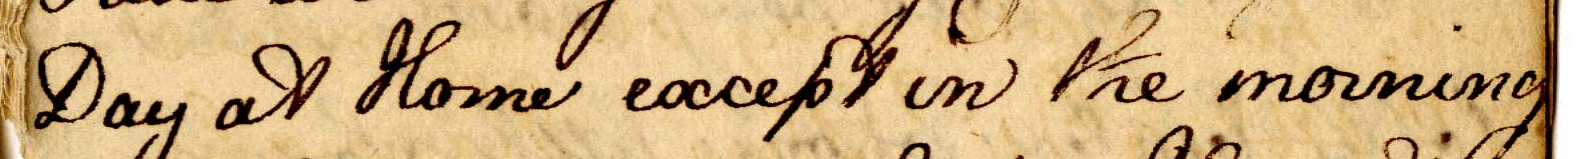Day at Home except in the morning
